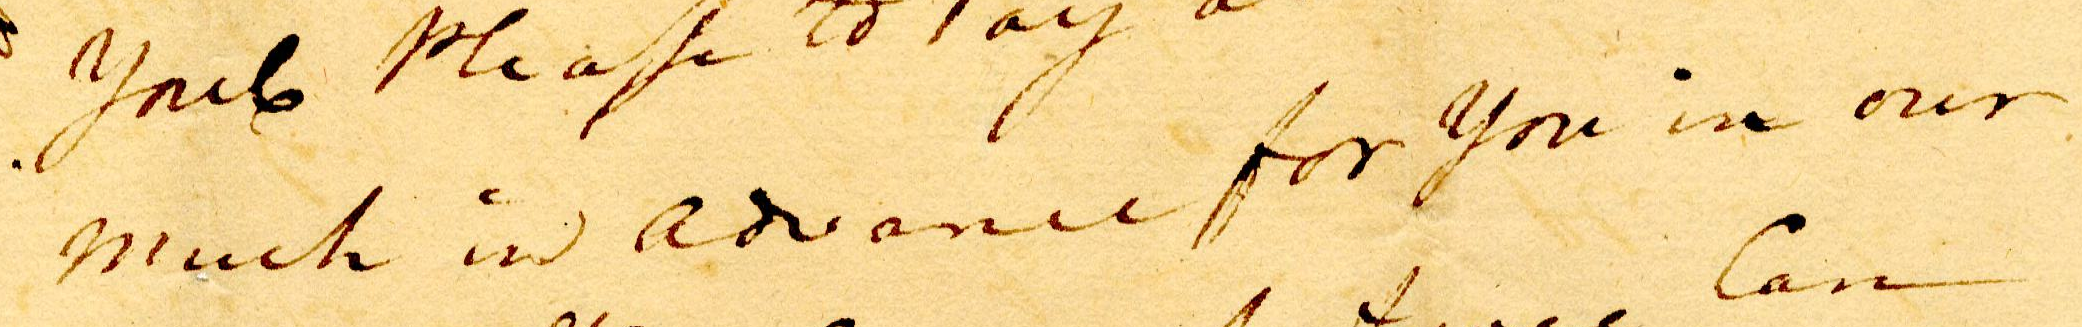much in advance for you in our
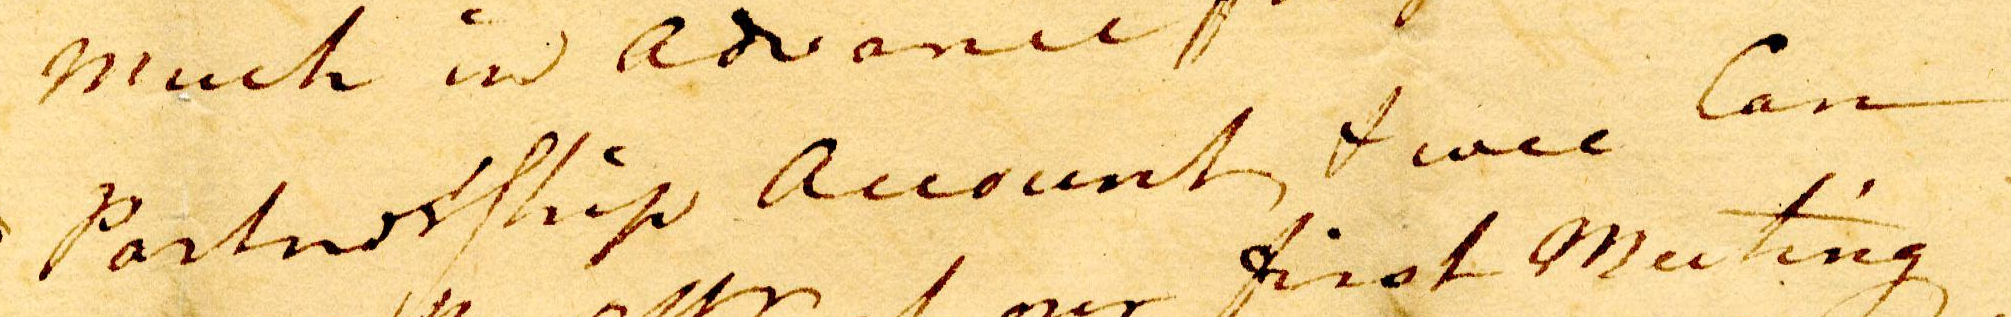Partnership account & wee Can
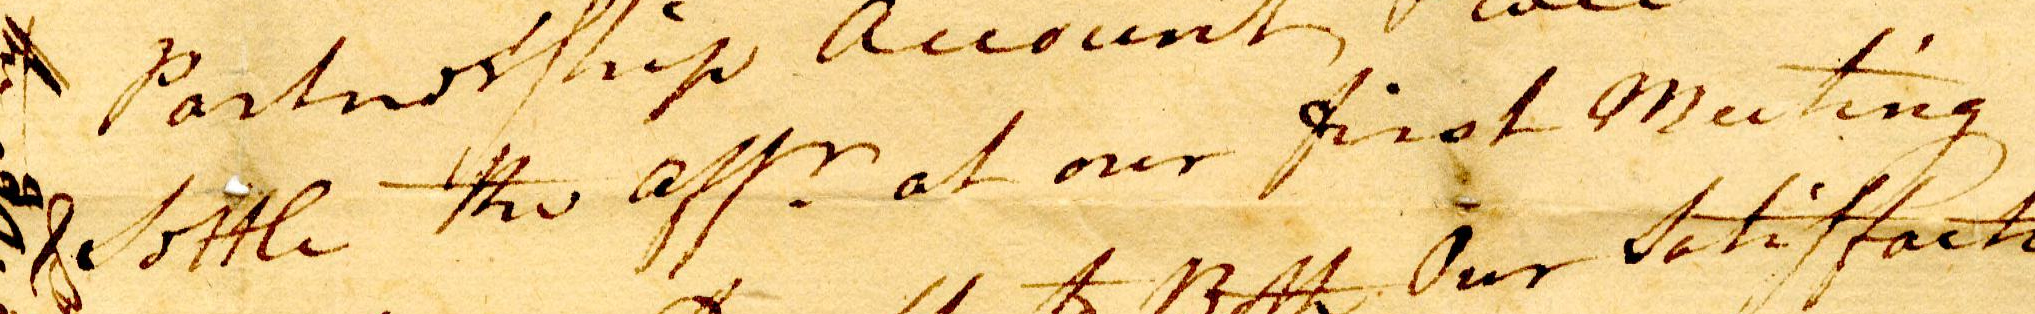settle the aff^r. at our first Meeting
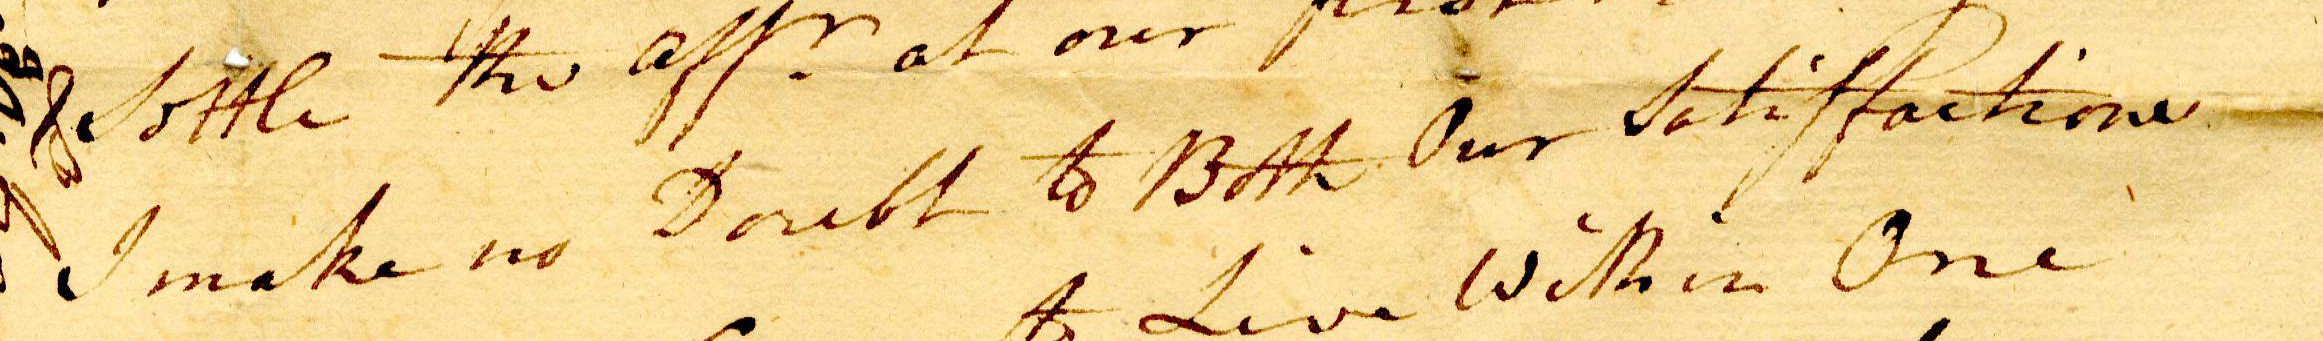I make no Doubt to Both our Satisfaction
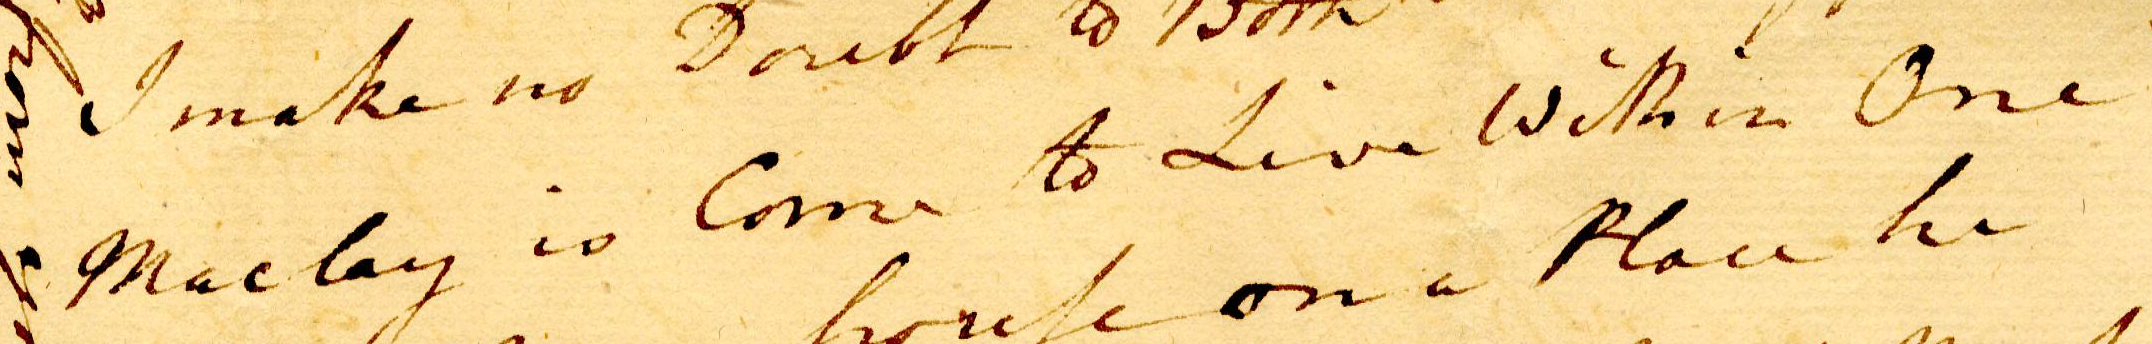Maclay is Come to Live Within One
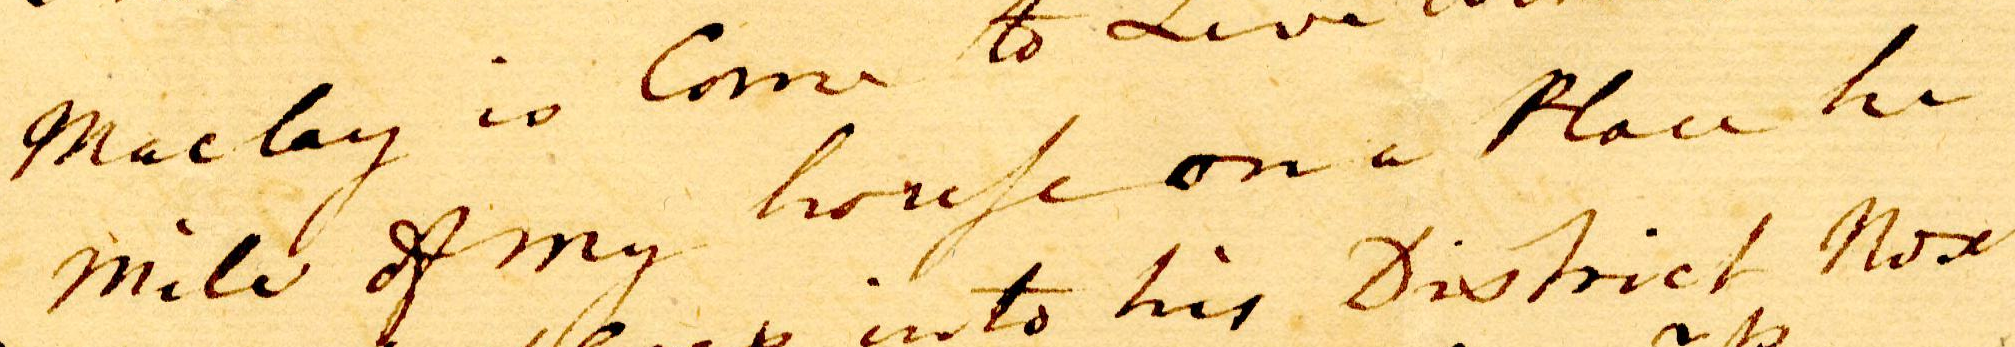mile of my house on a Place he
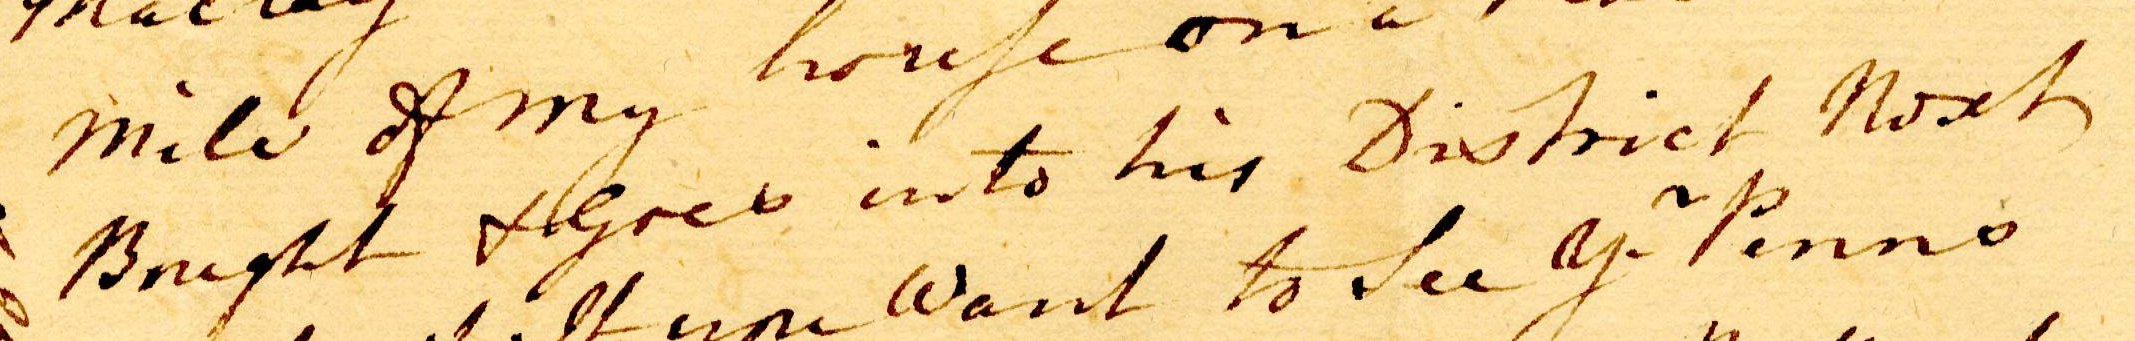Brought & goee into his District next
